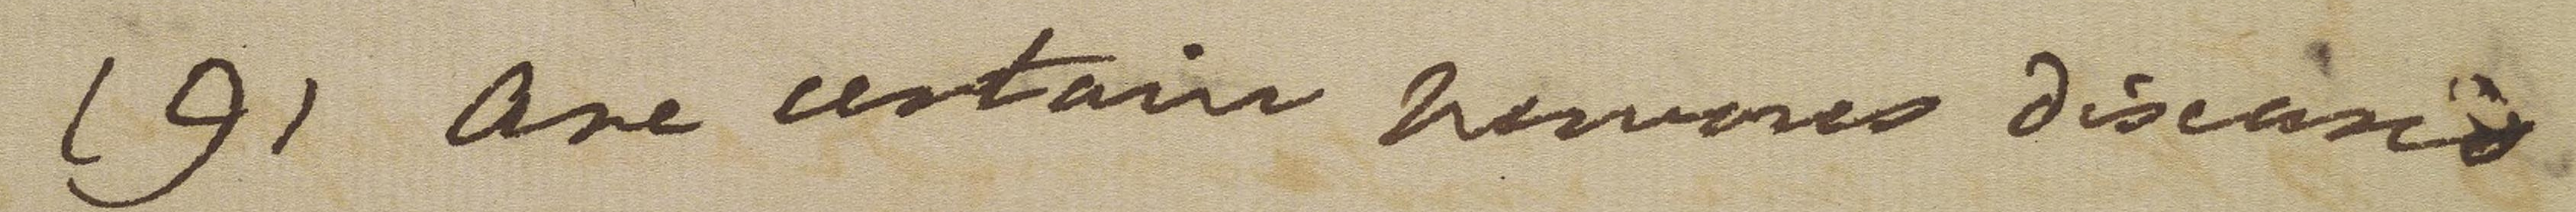(9) Are certain nervous diseases
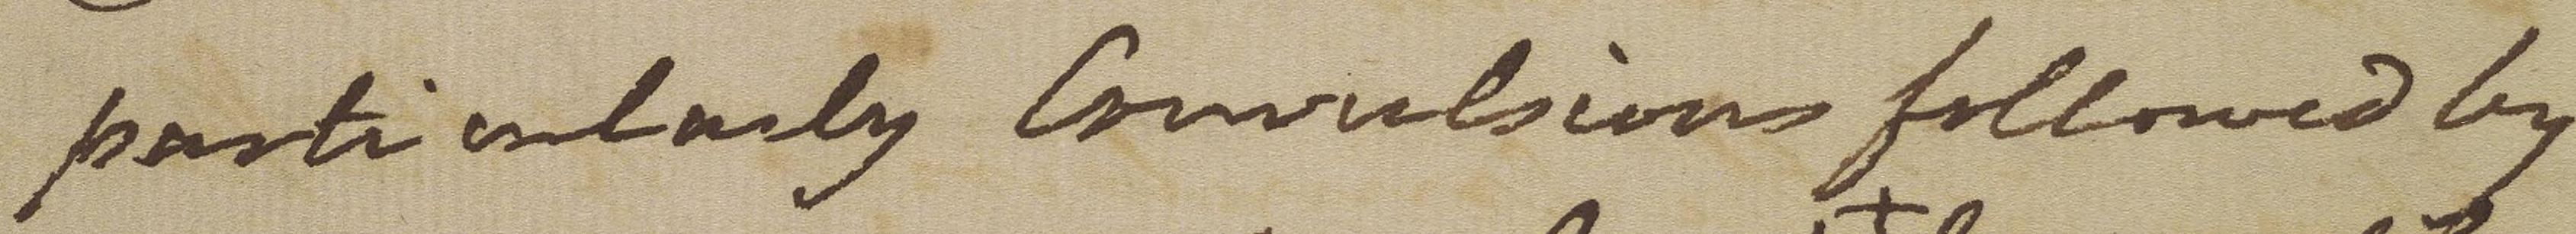particularly convulsion followed by
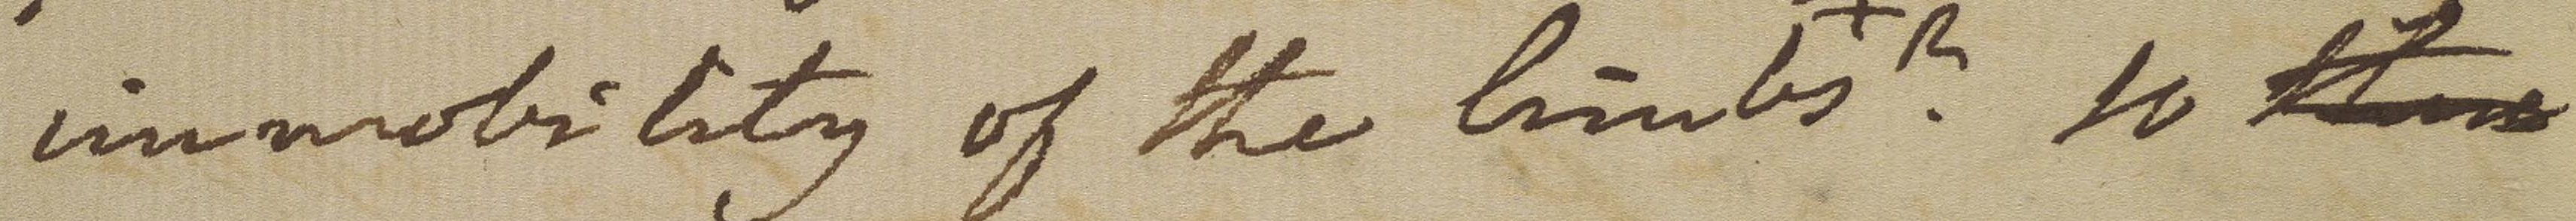immobility of the limbs^+? So [____]
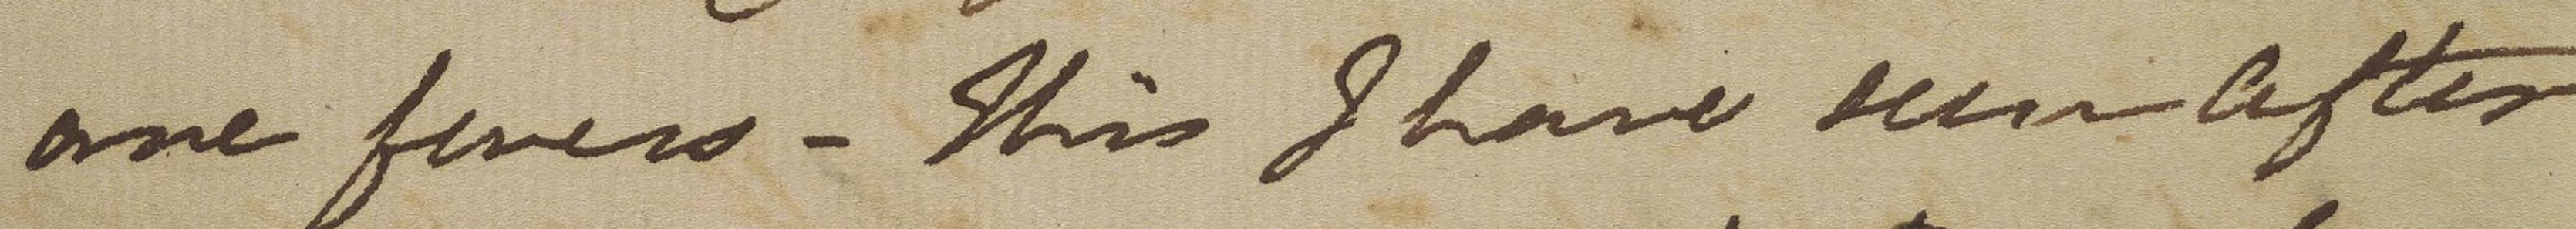are fevers. This I have seen after
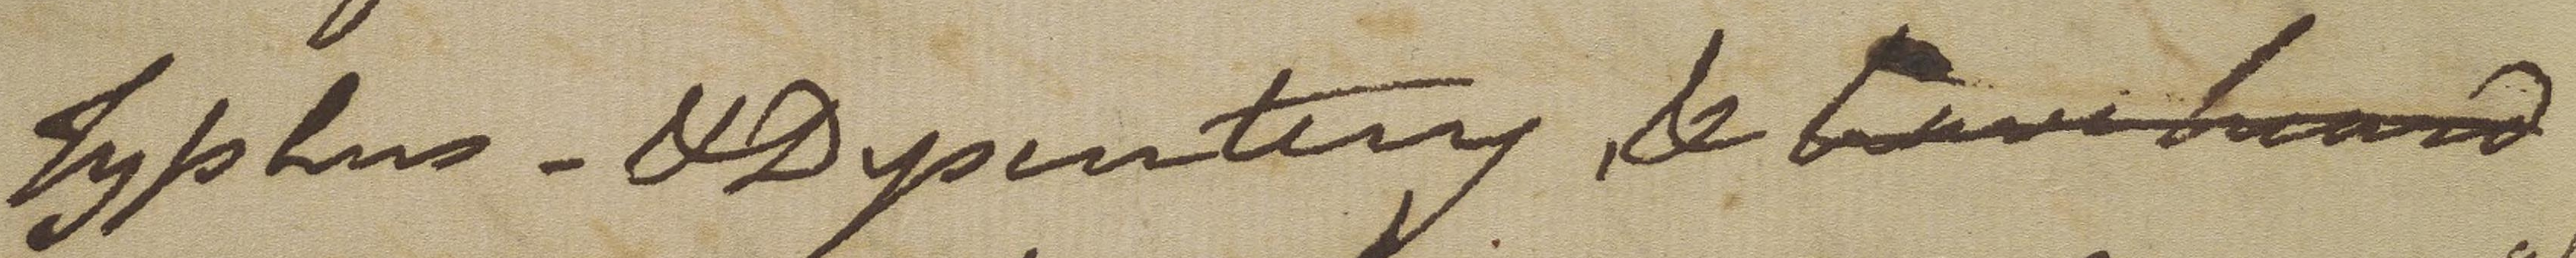Typhus- & Dysentery- & [have heard]
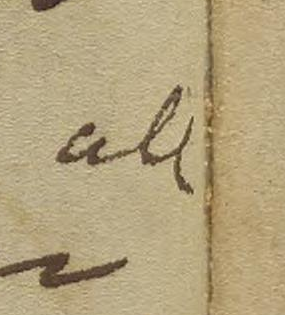all
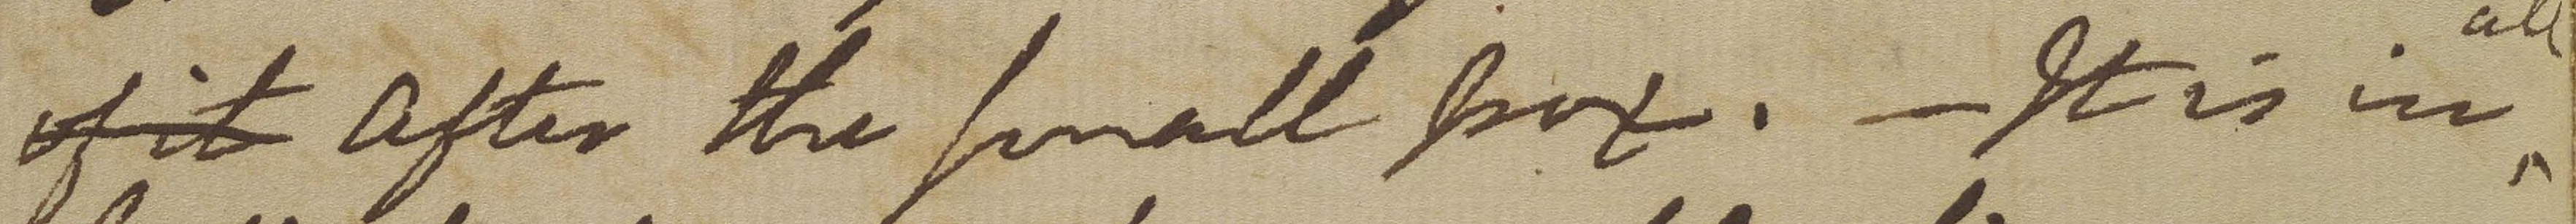[of it] after the small pox.- It is in ^
